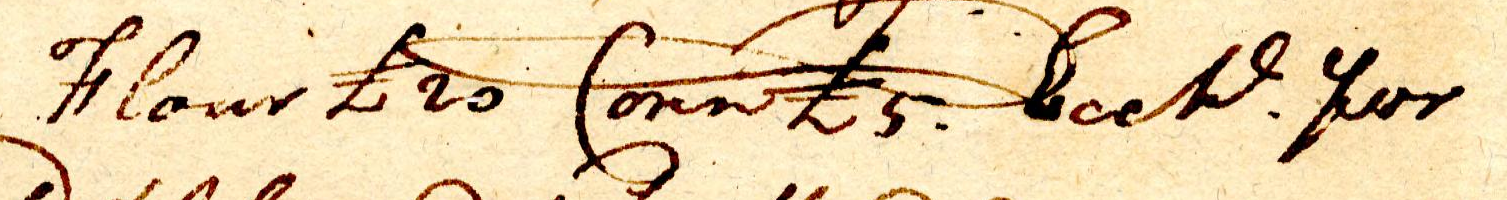Flour £20 Corn £5 Exch^d. for
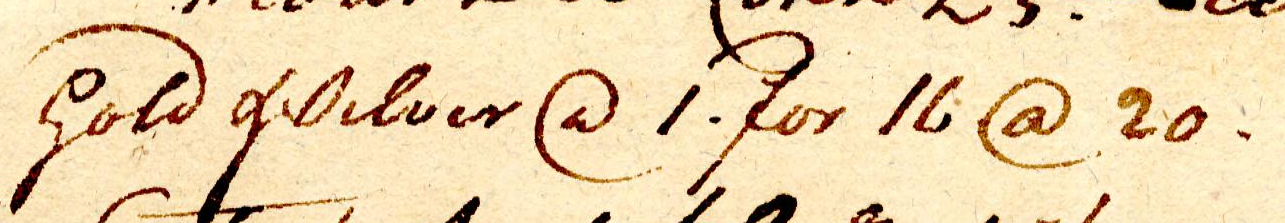gold & silver @ 1 for 16 @ 20
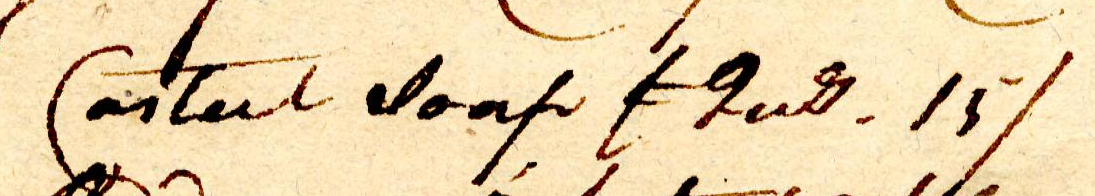Casteel Soap £2[___] 15s
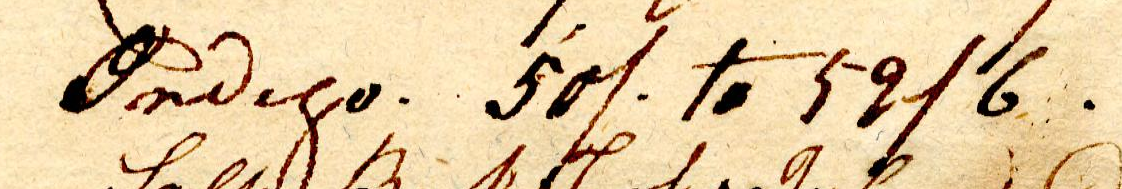Indigo. 50s to 59s 6.
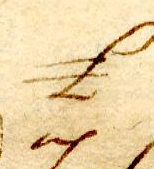£
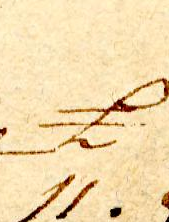£
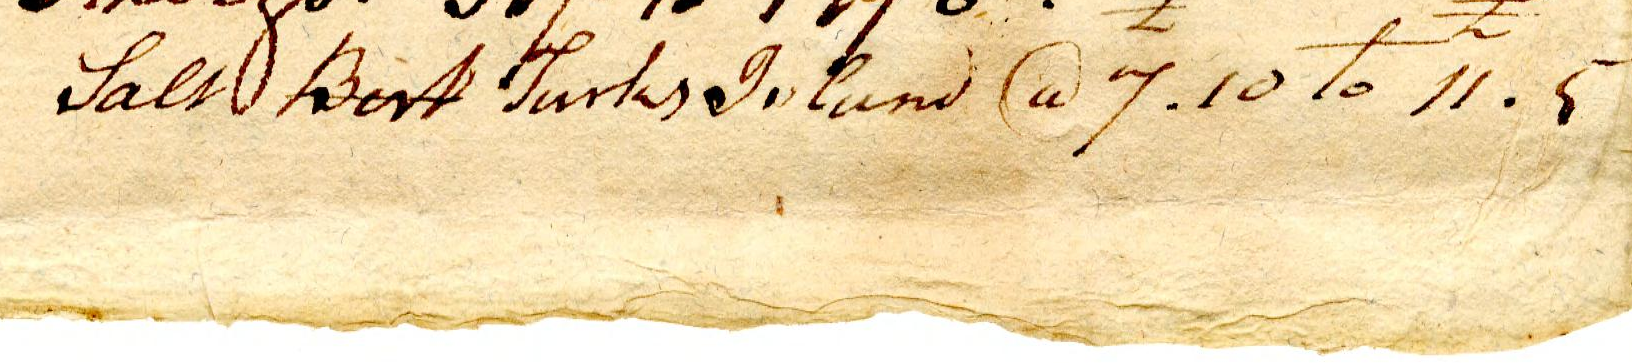Salt [Bat] Turks Island @ 7.10. 10 11.5
